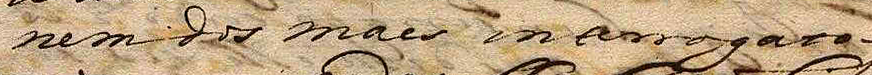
nem dos maes interrogato
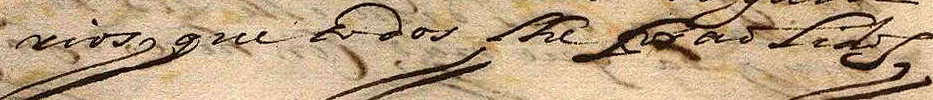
rios que todos lhe foraõ Lidos
